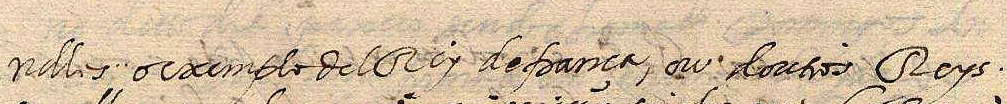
nelles o exemplo del Rey de frança, ou doutros Reys.
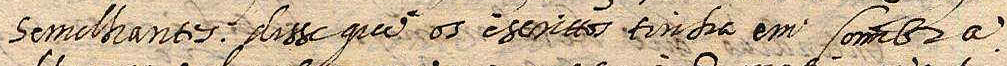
semelhantes disse que os escrittos tinha em Coimbra
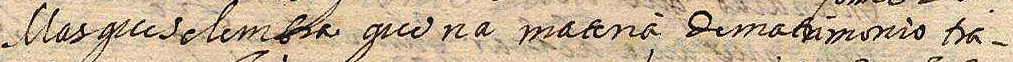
Mas que se lembra que na materia de matrimonio tra
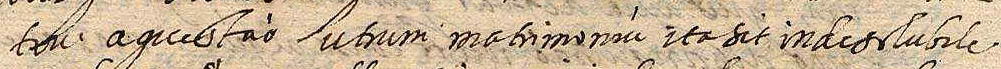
tou a questaõ utrum matrimoniū ita sit indesolubile
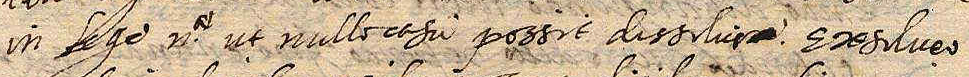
in lego n.a ut nullo casū possit dissolui E resolueo
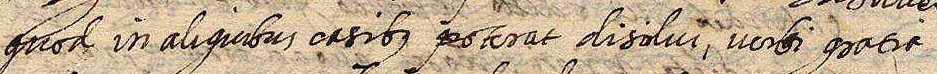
quod in aliguibus casibꝯ poterat disolui, uerbi gratia
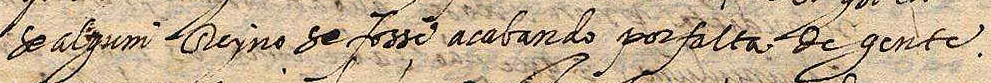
se algum Reyno se fosse acabando por falta de gente
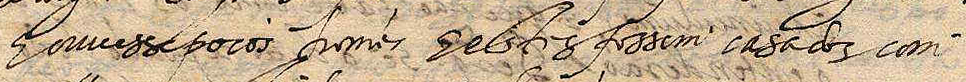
E ouuesse pocos homēs E estes fossem casados com
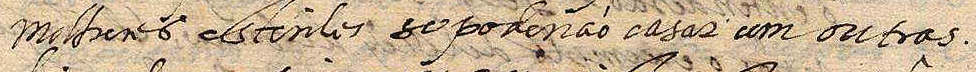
molheres esteriles se poderiaõ casar com outras.
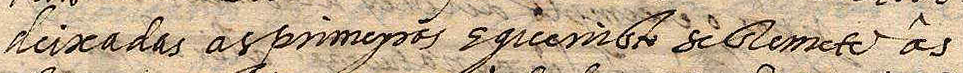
deixadas as primeyras E que nisto se Remete âs
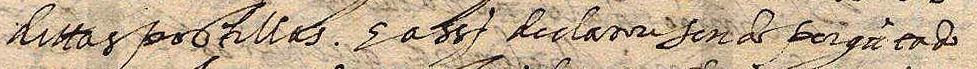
dittas postillas. E assj declarou sendo pergūtado
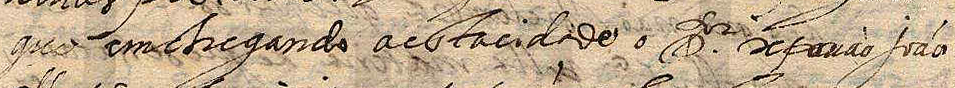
que em chegando a esta cidade o D.tor xpouão João
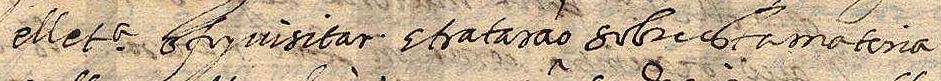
elle ta. o foy uisitar E tratarão sobre esta materia
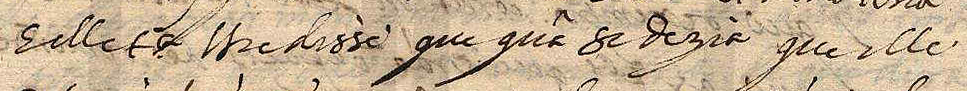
E elle t.a lhe disse que quâ se dezia que elle
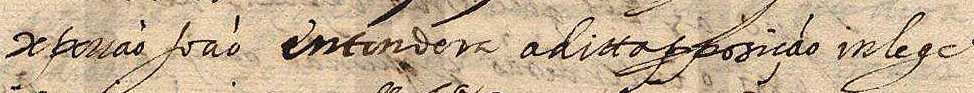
xpouão João entendera a ditta ꝓposição in lege
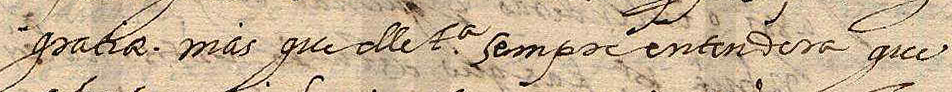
gratiæ. mas que elle t.a sempre entendera que
